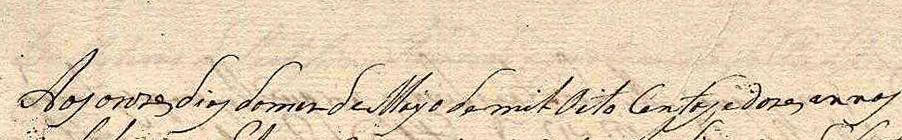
Aos onze dias do mez de Mayo de mil OitoCentos, e doze annos
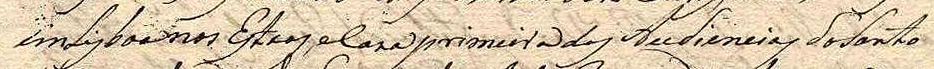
em Lisboa nos Estaos, e Caza primeira das Audiencias do Santo
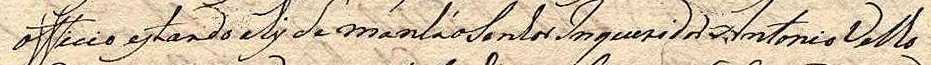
officio estando ahy de manhã o Senhor Inquizidor Antonio Velho
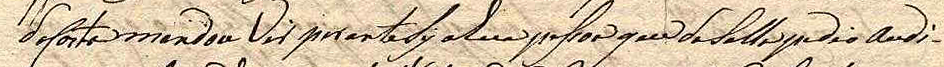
da Costa mandou Vir perante Sy a hua pessoa que da Salla pedio audi
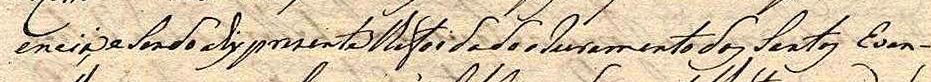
encia, e sendo ahy prezente lhe foi dado o Iuramento dos Santos Evan
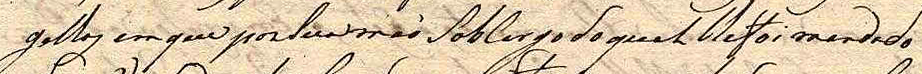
gelhos em que poz Sua maõ Sob Cargo do qual lhe foi mandado
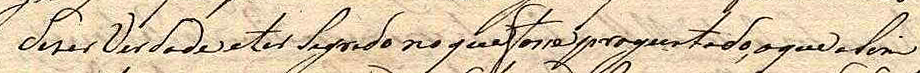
dizer Verdade e ter Segredo no que fosse proguntado, o que aSim
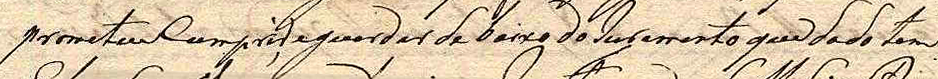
prometeu Cumprir, e guardar debaixo do Iuramento que dado tem
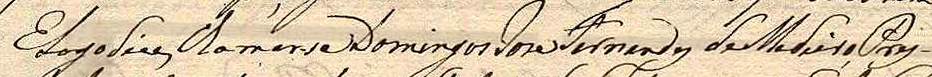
E Logo dice, chamar-se Domingos Ioze Fernandes de Madeiro Pres
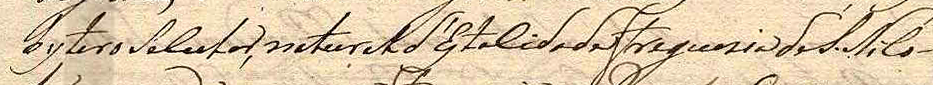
bytero SeCular, natural d'Esta Cidade freguezia de S. NiCo
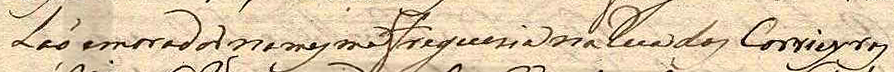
Laõ, e morador na mesma freguezia na Rua dos Corrieyros
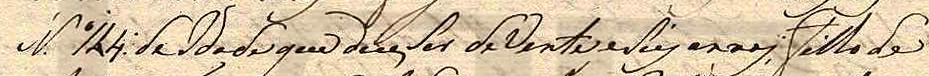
N.º 144 de Idade que dice Ser de Vinte e seis annos, filho de
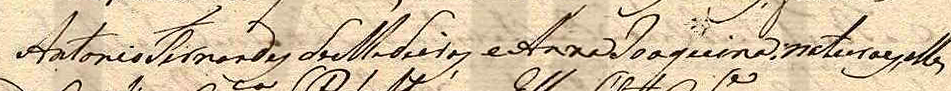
Antonio Fernandes de Medeiros, e Anna Ioaquina; naturaes, elle
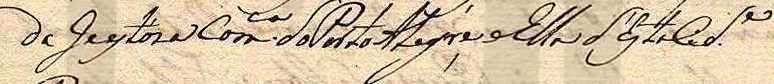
de Justoza Com.a do Porto Alegre, e Ella d'Esta Cid.e
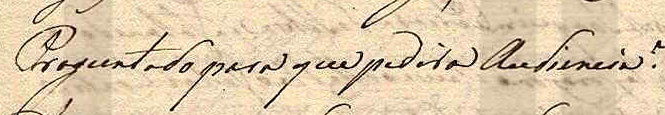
Proguntado para que pedira audiencia?
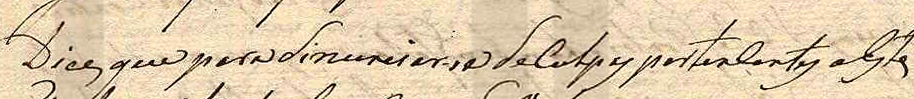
Dice que para dinunciar-se de Culpas pertencentes a Este
